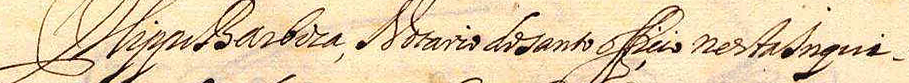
Filippe Barboza, Notario do santo offiçio nesta Inqui
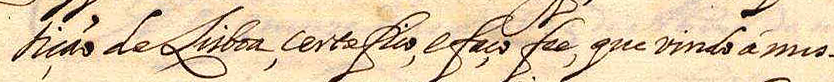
siçaõ de Lisboa, certefico, e faço fee, que vindo á mes
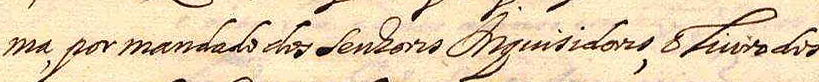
ma, por mandado dos Senhores Inquisidores, o Liuro dos
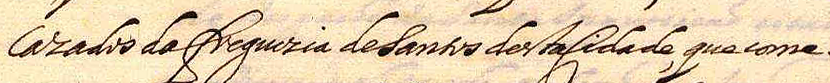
Cazados da freguezia de Santos desta Cidade, que come
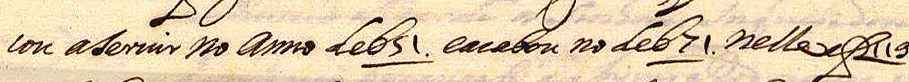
cou a seruir no anno de 651. e acabou no de 671. nelle a f 119.
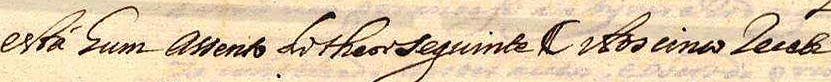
está hum assento do theor seguinte ⁋ Aos cinco Recebi
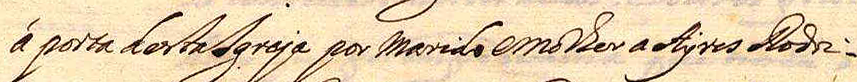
á porta desta Igreja por marido e molher a Ayres Rodri
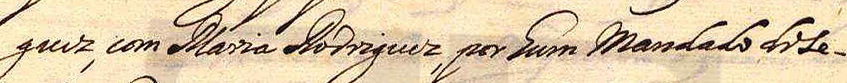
guez, com Maria Rodriguez, por hum mandado do se
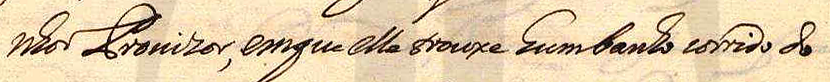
nhor Prouizor, em que ella trouxe hum banho corrido do
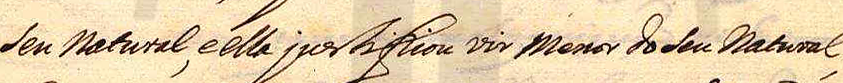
seu natural, e elle justificou vir menor do seu natural,
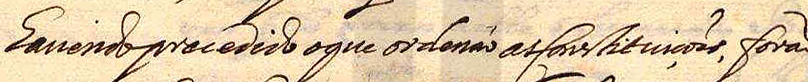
hauendo precedido o que ordenaõ as Constituiçoẽs, foraõ
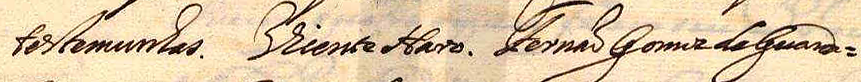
testemunhas. Vicente Haro. Fernaõ Gomez da Guarda =
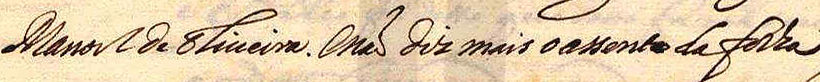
Manoel de oliueira. E naõ diz mais o assento da folha
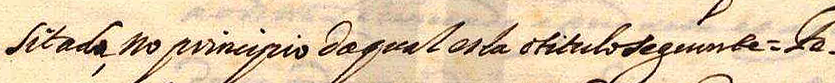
sitada, no principio da qual esta o titulo seguinte = Fe
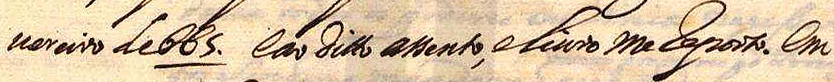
uereiro de 665. E ao ditto assento, e liuro me Reporto. Em
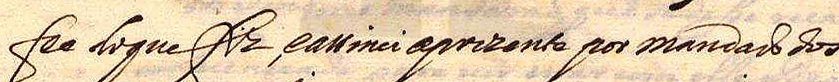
fee do que fiz, e assinei a prezente por mandado dos
